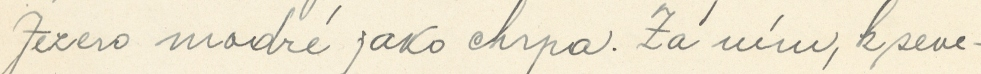Jezero modré jako chrpa. Za ním, k seve-
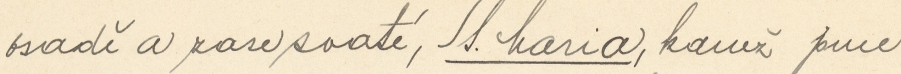osadě a zase svaté, St. Maria, kamž jsme
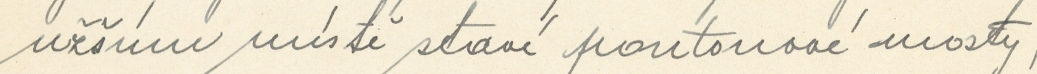užším místě staví pontonové mosty,
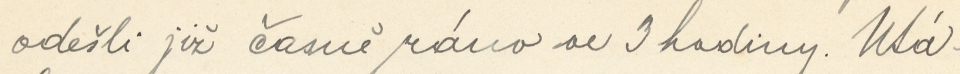odešli již časně ráno ve 3 hodiny. Utá-
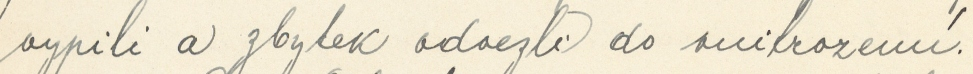vypili a zbytek odvezli do vnitrozemí.
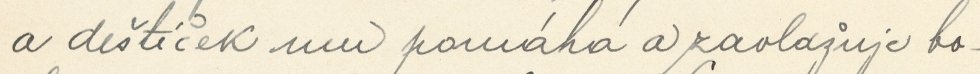a deštíček mu pomáhá a zavlažuje bo-
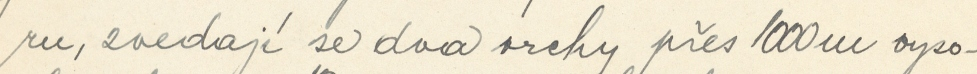ru, zvedají se dva vrchy přes 1000 m vyso-
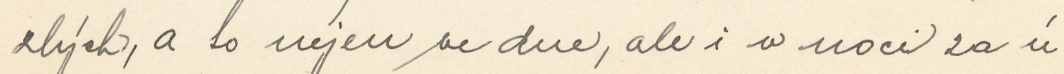zlých, a to nejen ve dne, ale i v noci za ú-
